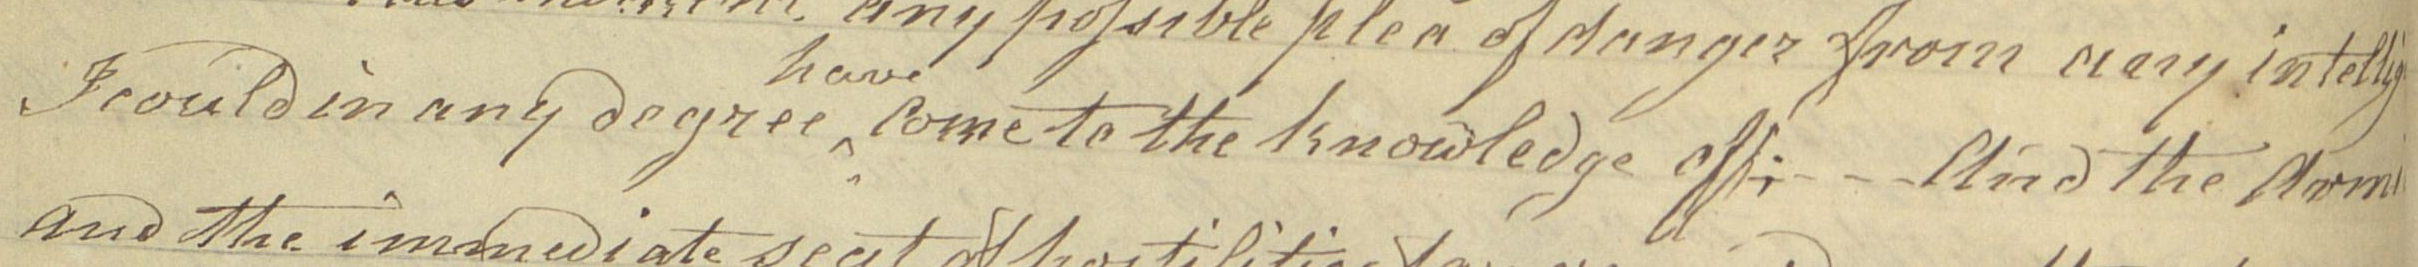I could in any degree ^ come to the knowledge off; And the Arm
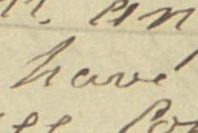have
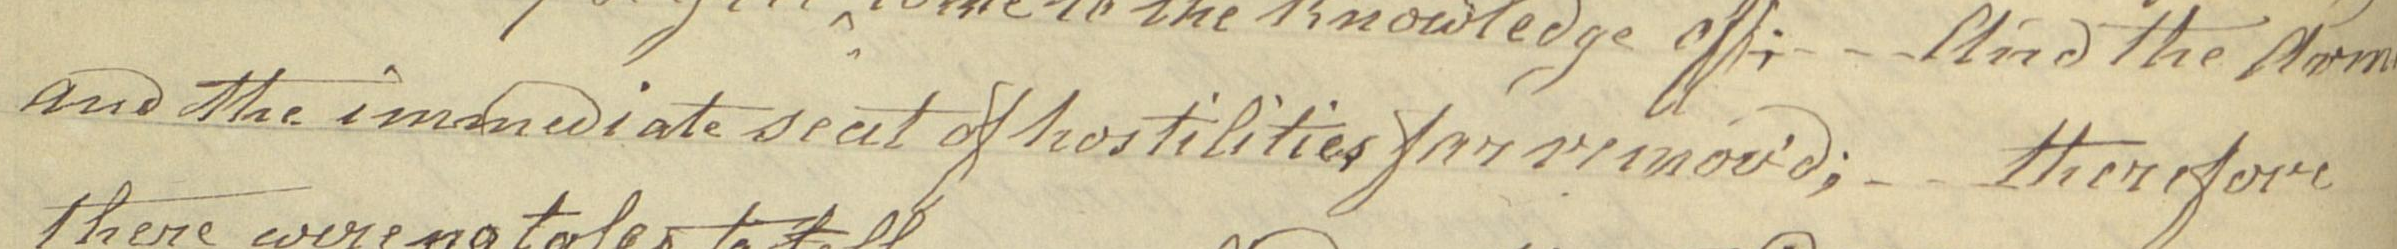and the immediate seat of hostilities far remov'd; therefore
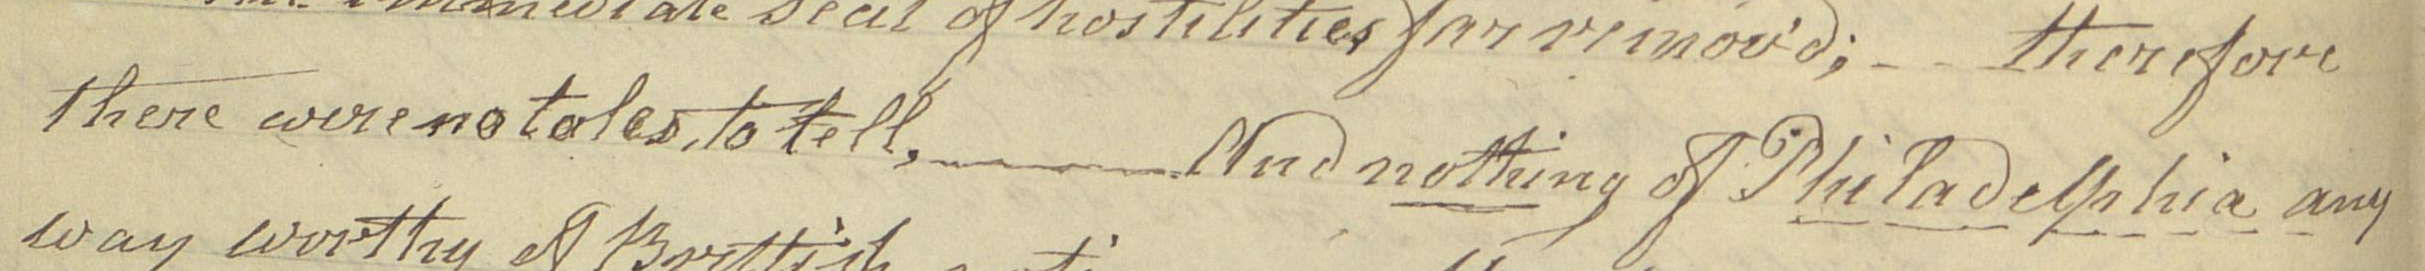there were no tales to tell, And nothing of Philadelphia any
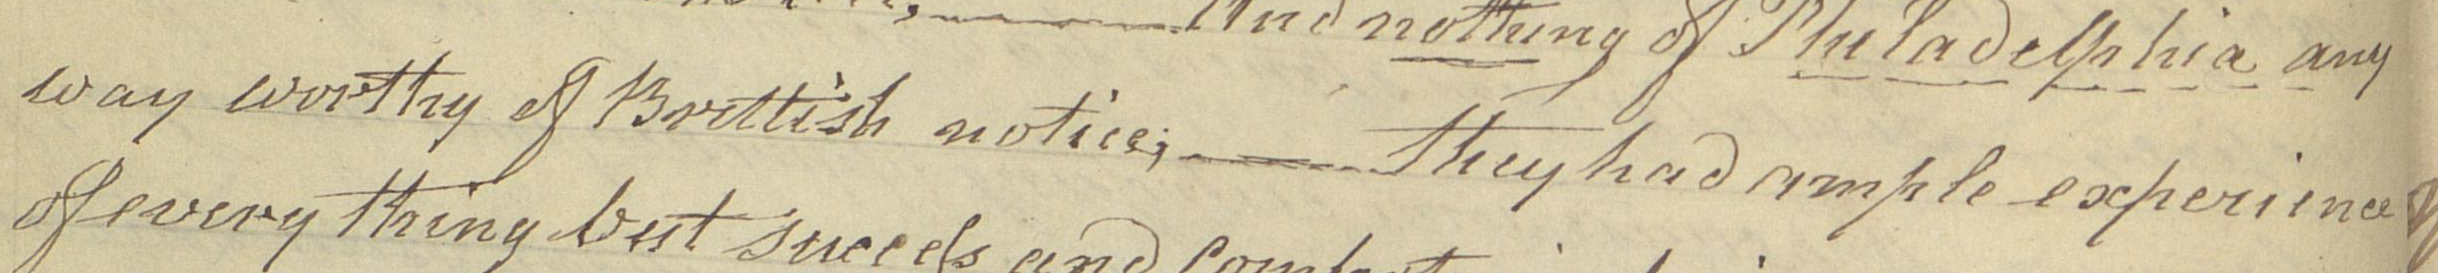way worthy of Brittish notice; they had ample experience
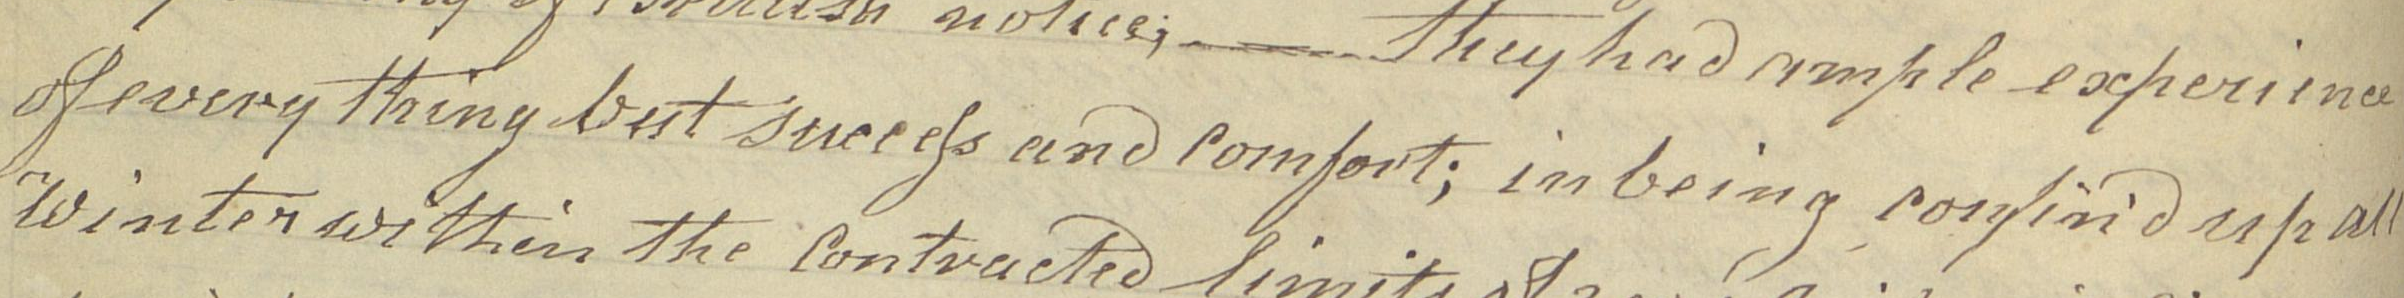of every thing but success and comfort; in being confin'd up all
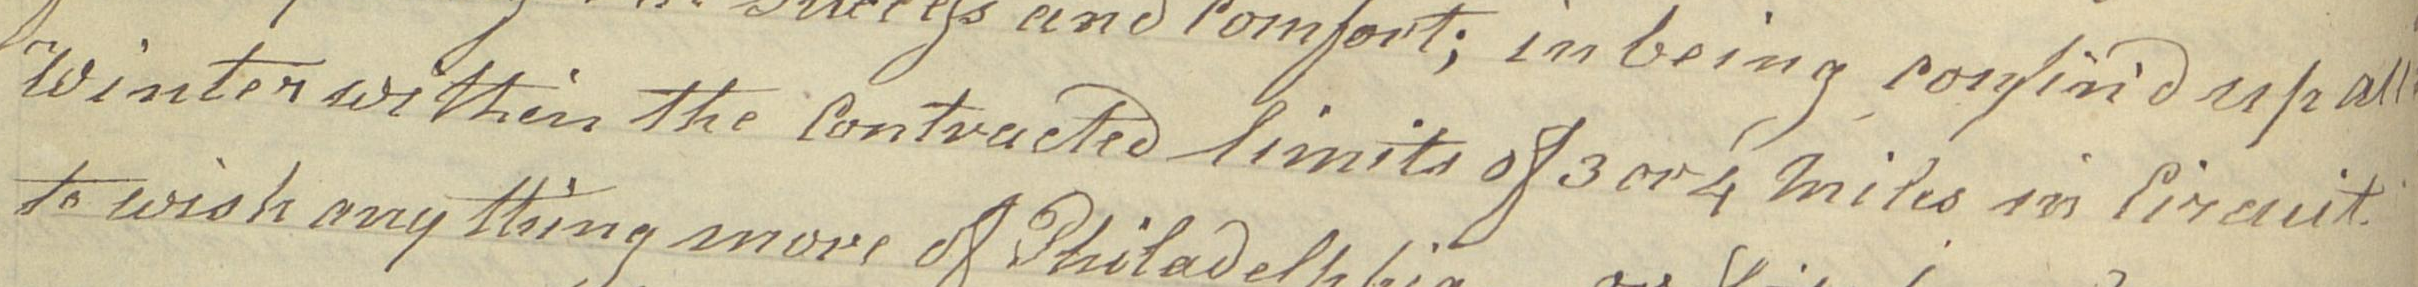winter within the contracted limits of 3 or 4 miles in Circuit
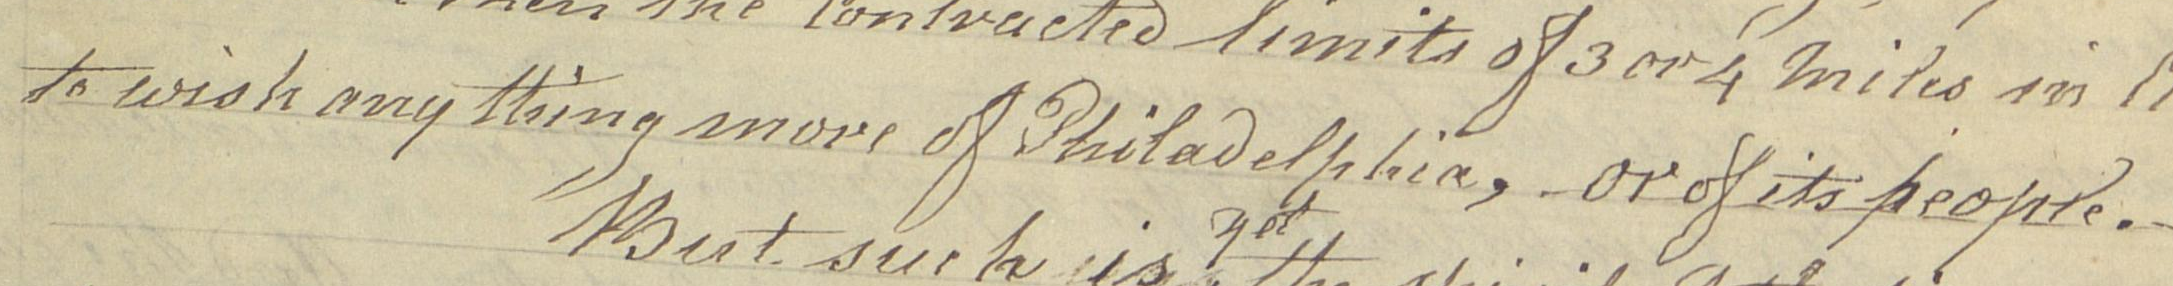to wish any thing more of Philadelphia, or of its people.
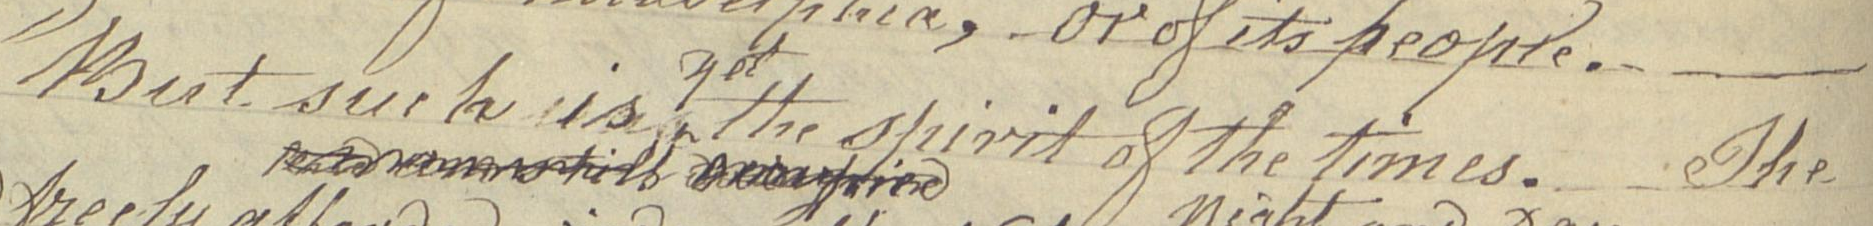But such is ^ the spirit of the times. The
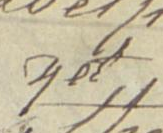yet
